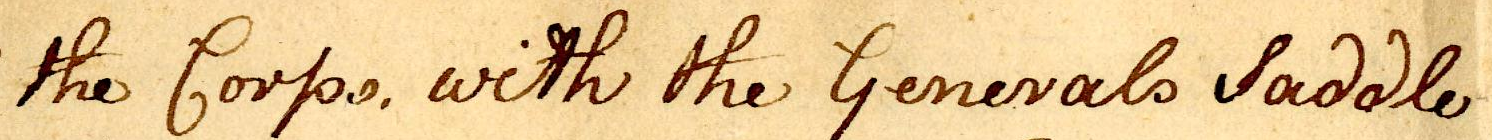the Corps. with the Generals Saddle
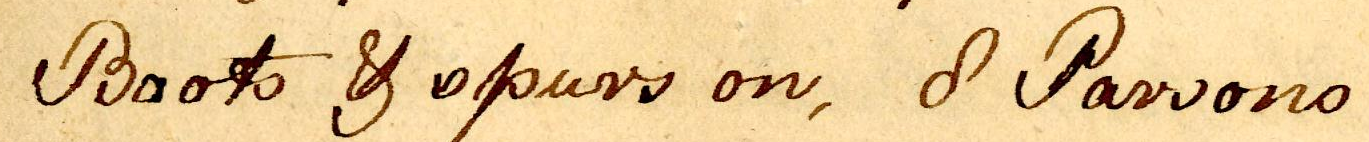Boots & spurs on, & Parvono
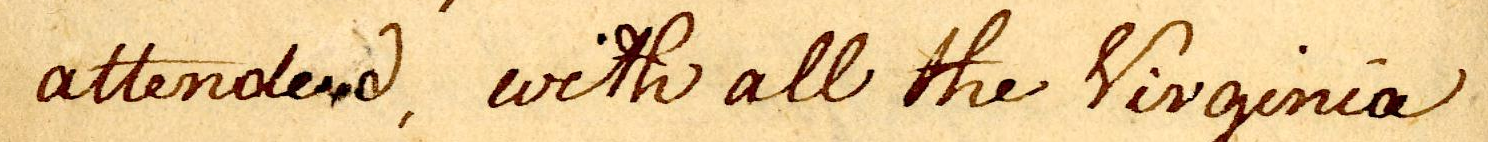attended, with all the Virginia
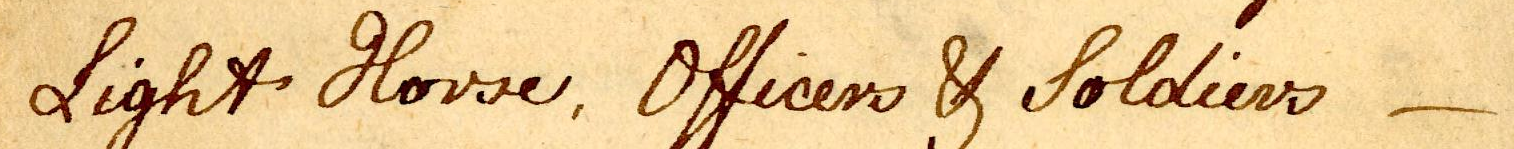Light Horse, Officers & Soldiers -
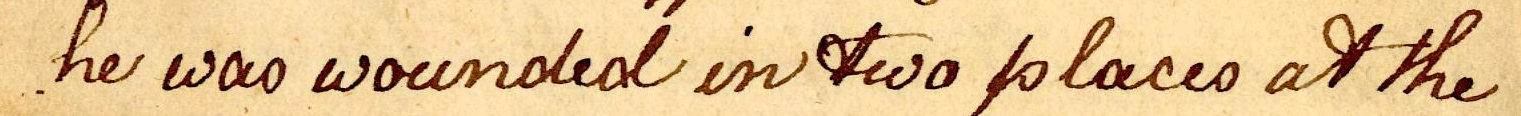he was wounded in two places at the
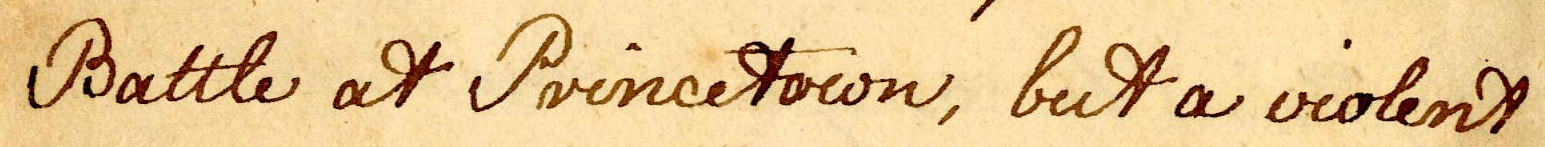Battle at Princetown, but a violent
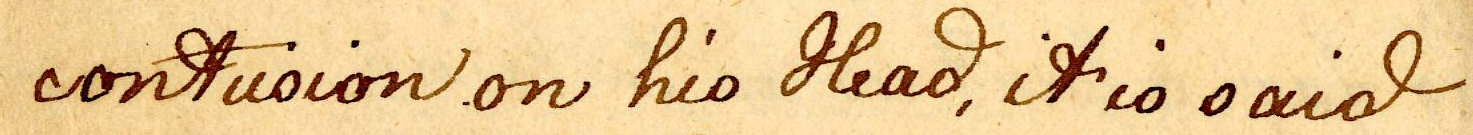contusion on his Head, it is said
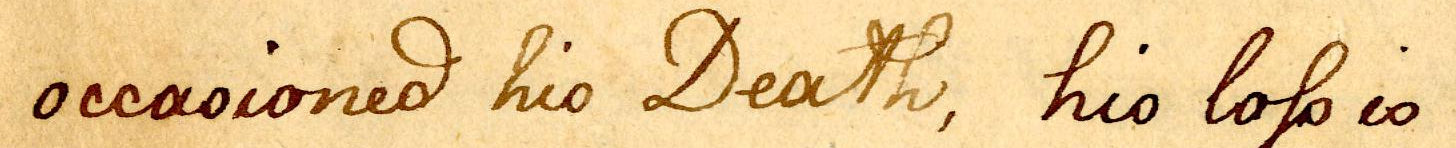occasioned his Death, his loss is
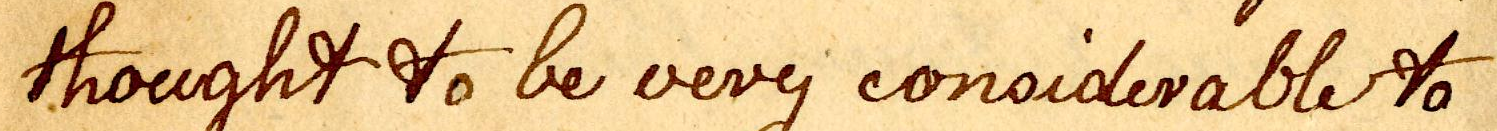thought to be very considerable to
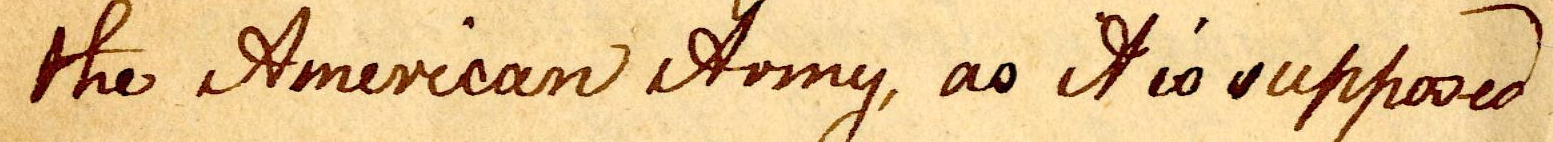the American Army, as it is supposed
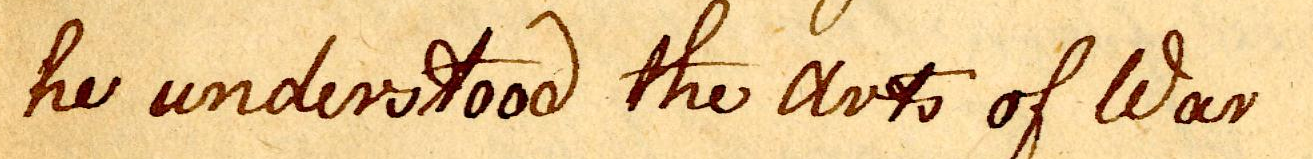he understood the Arts of War
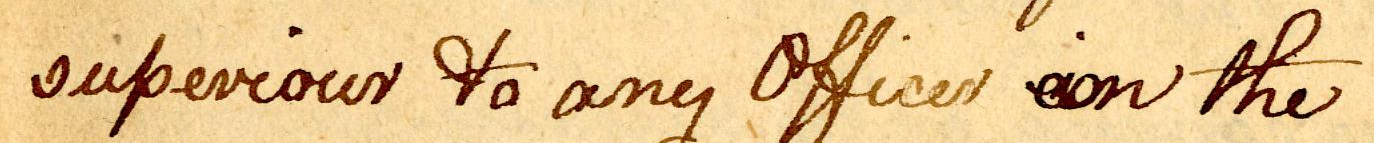superiour to any Officer in the
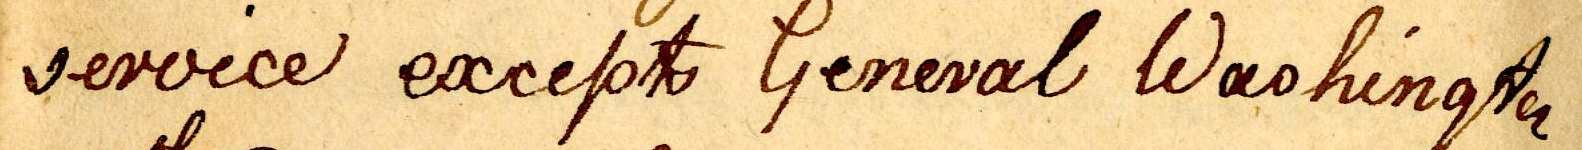service except General Washington
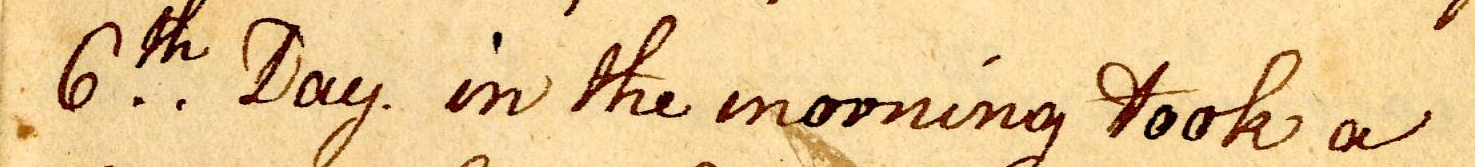6^th Day. in the morning took a
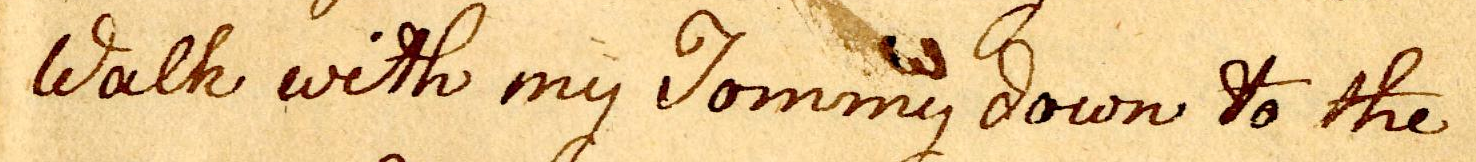Walk with my Tommy down to the
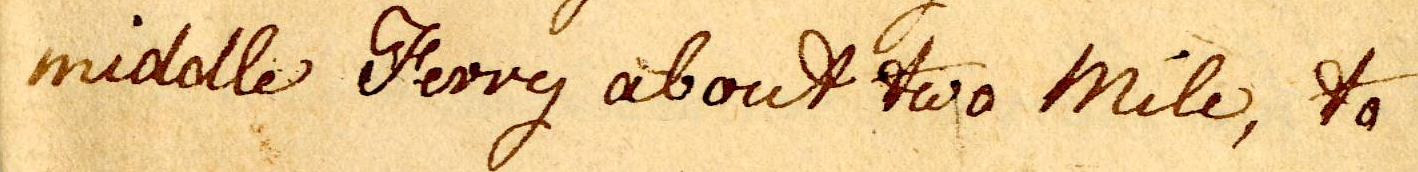middle Ferry about two Mile, to
